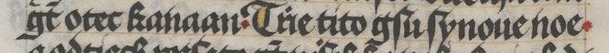ḡt otec kanaan.Tṙie tito gſu ſynoue noe.
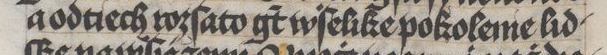a odtiech rozſato ḡt wẛelike pokolenie lid¬
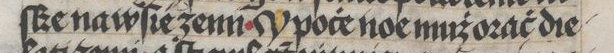ſke nawẛie żemi.Y poċe noe muż oraċ die¬
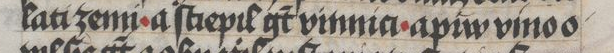lati zemí.a ẛtiepil ḡt vinnici.a piw víno o¬
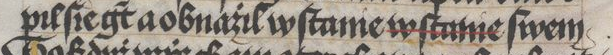vil ſie ḡt a obnażil wſtanie wſtanie ſwem
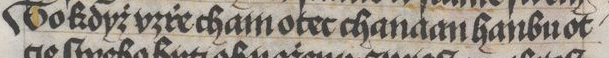Do kdyż vzṙe cham otec chanaan hanbu ot¬
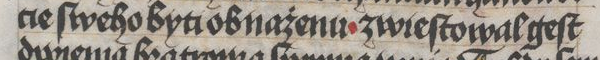cie ſweho byti obnażenu.zwieſtowal geſt
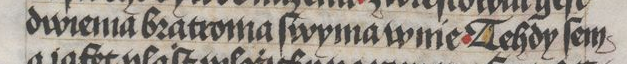dwiema bratroma ſwyma wnie.Tehdy ſem.
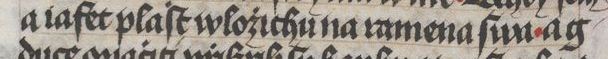a iafet plaẛt wlożíchu na ramena ſwa.a g¬
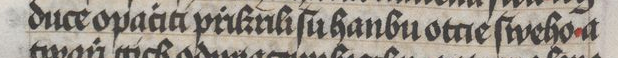duce opačiti pṙikṙili ſu hanbu otcie ſweho.a
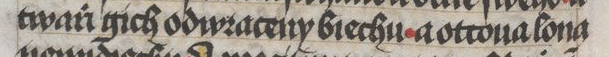twaṙí gich odwraceny biechu.a otcona lona
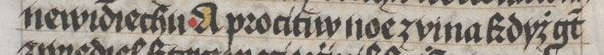newidiechu.A procitiw noe z vina když ḡt
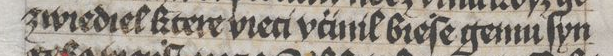zwiediel ktere vieci vċinil bieẛe gemu ſyn
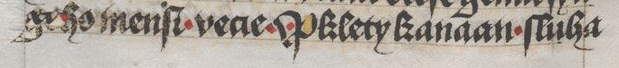geho menẛi.vecie.Ꝓklety kanaan.ſluha
